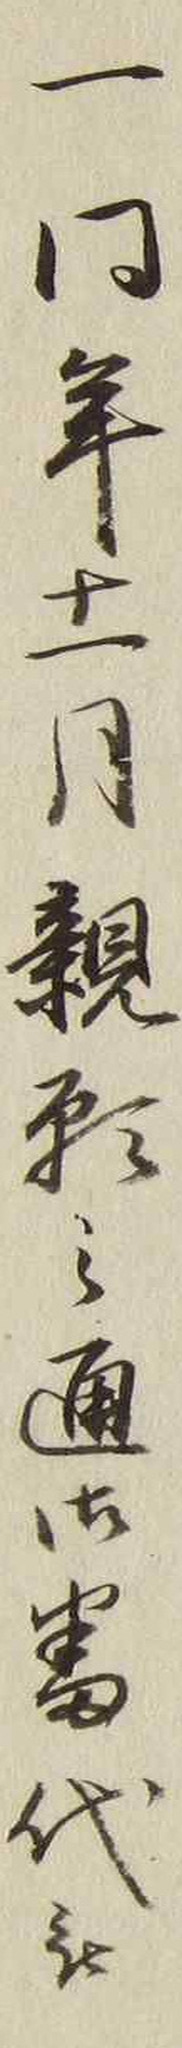一同年十一月親願之通御番代被

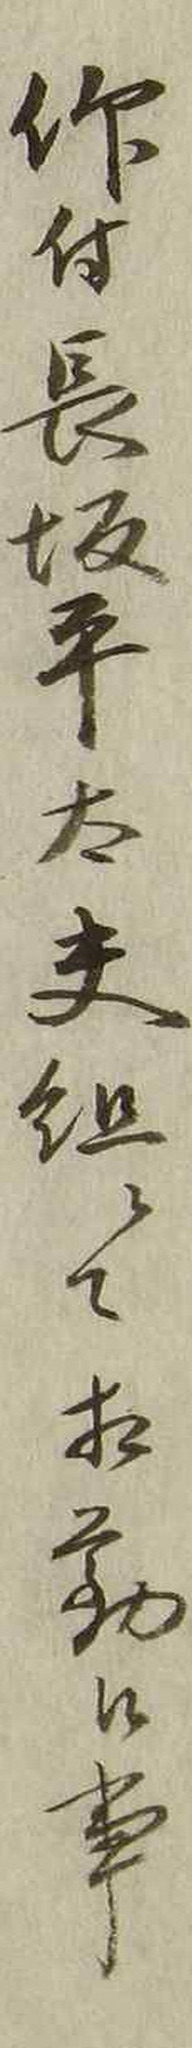仰付長坂平太夫組ニて相勤候事
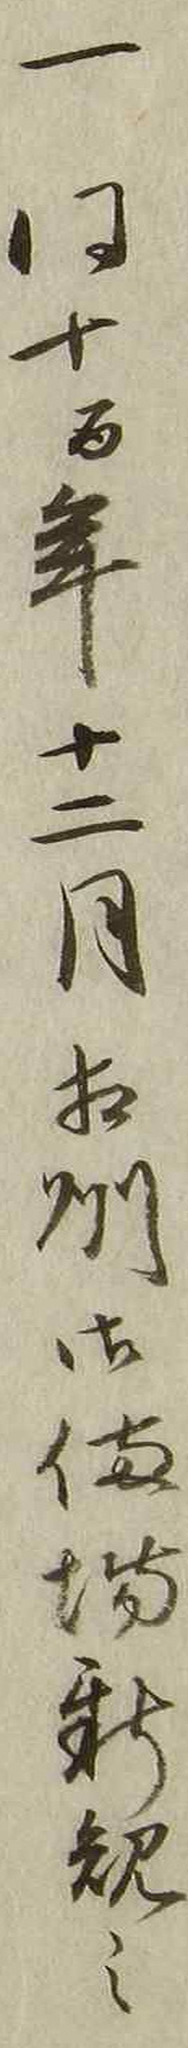一同十酉年十二月相州御備場新規之
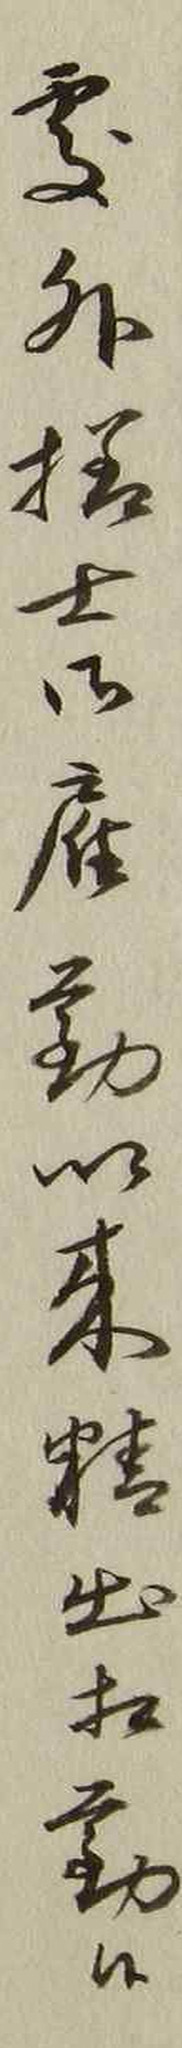処外様士御雇勤以来精出相勤候
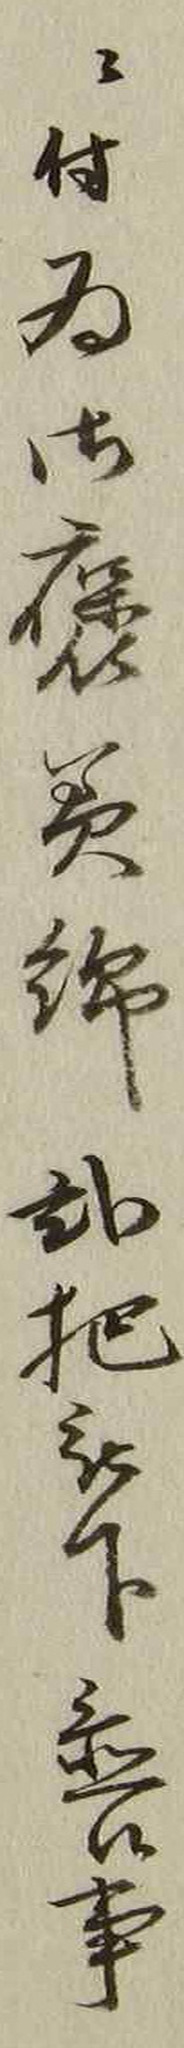ニ付為御褒美錦弐把被下置候事
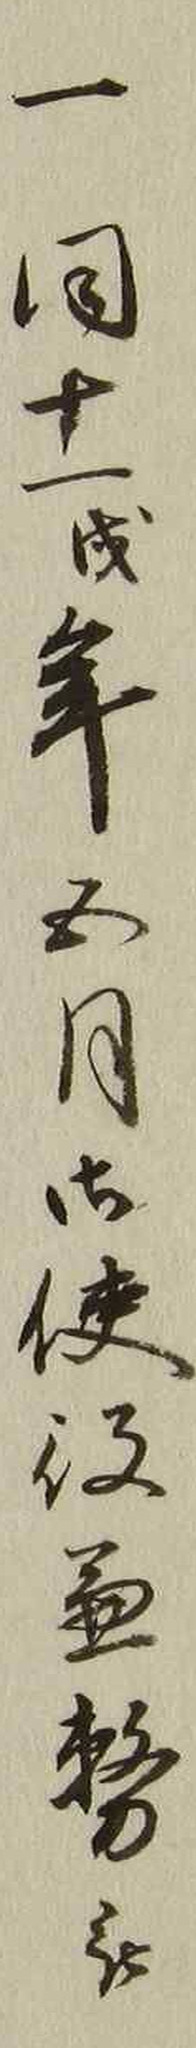一同十一戌年五月御使役兼務被
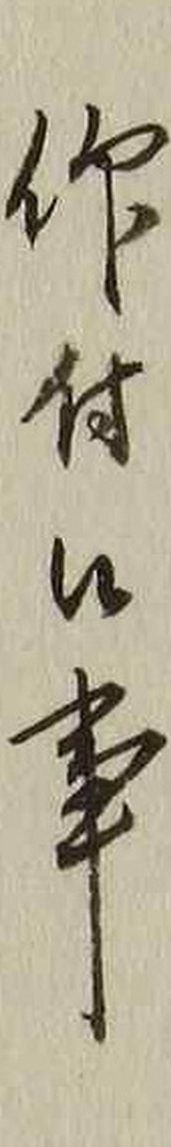仰付候事
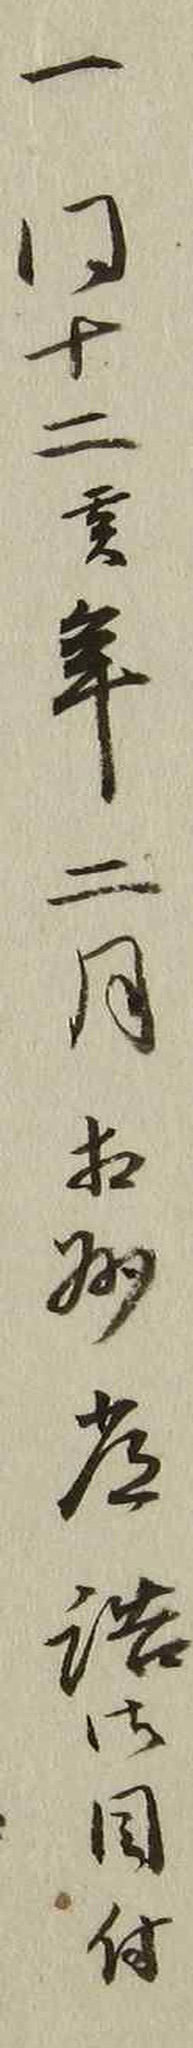一同十二亥年二月相州常詰御目付
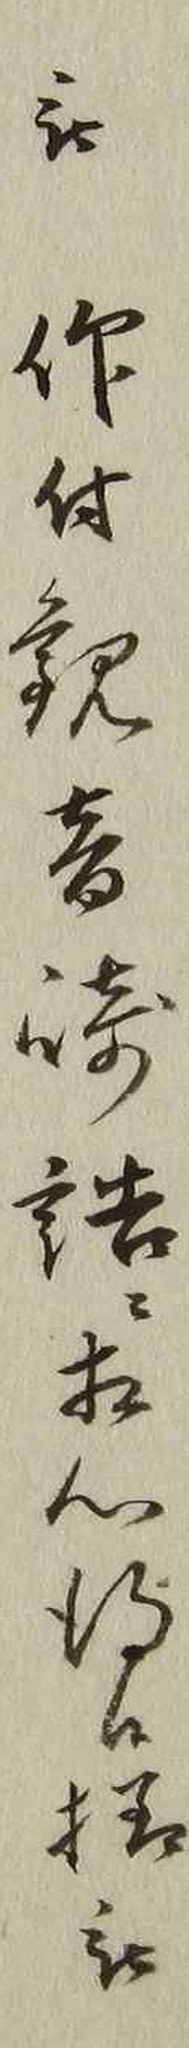被仰付観音崎詰ニ相心得候様被
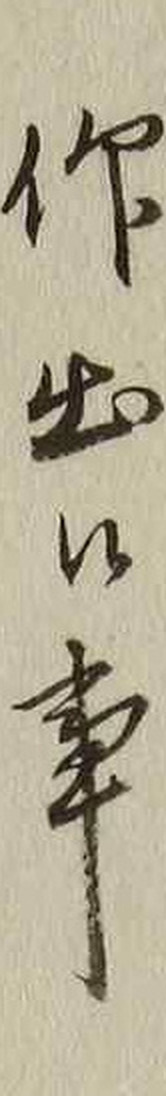仰出候事
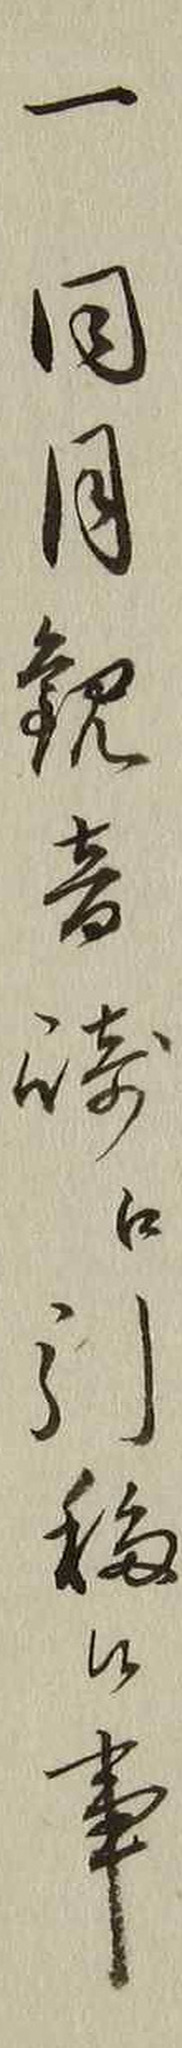一同月観音崎江引移候事
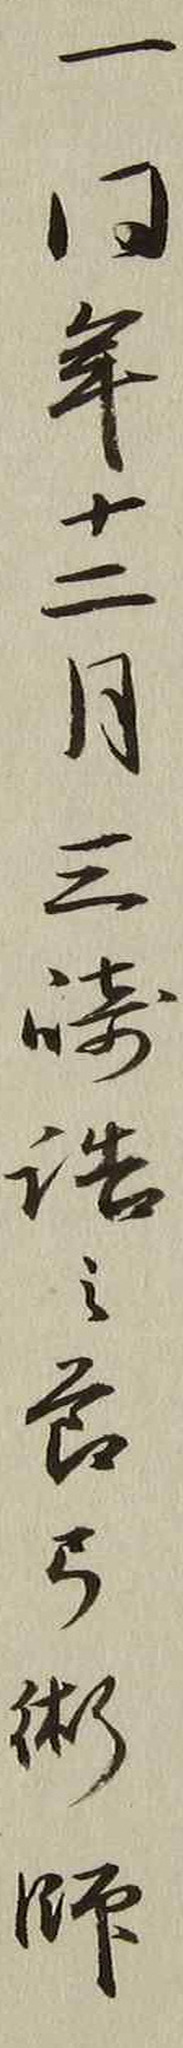一同年十二月三崎詰之節弓術師
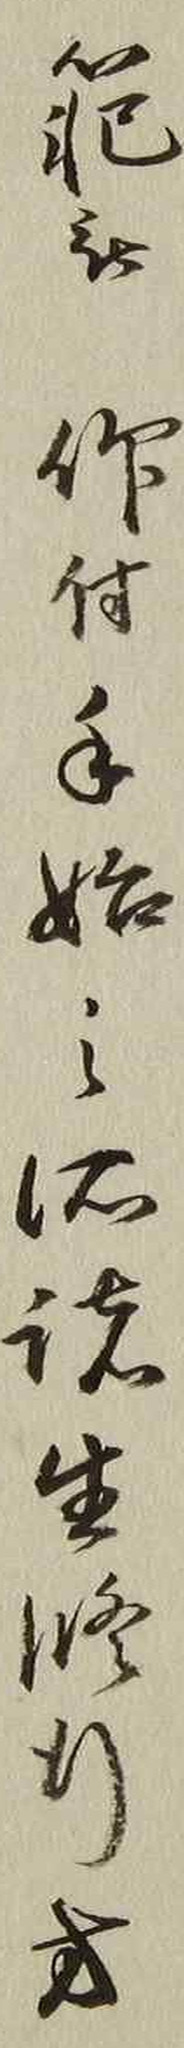範被仰付手始之所諸生修行方
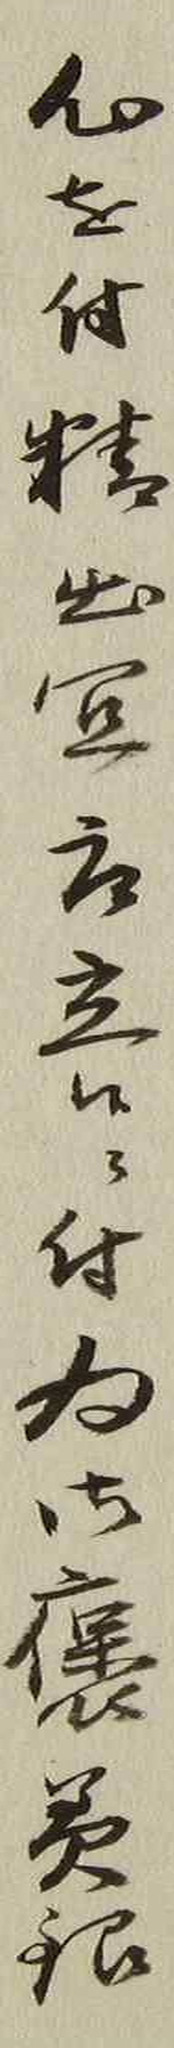心を付精出宜取立候ニ付為御褒美銀
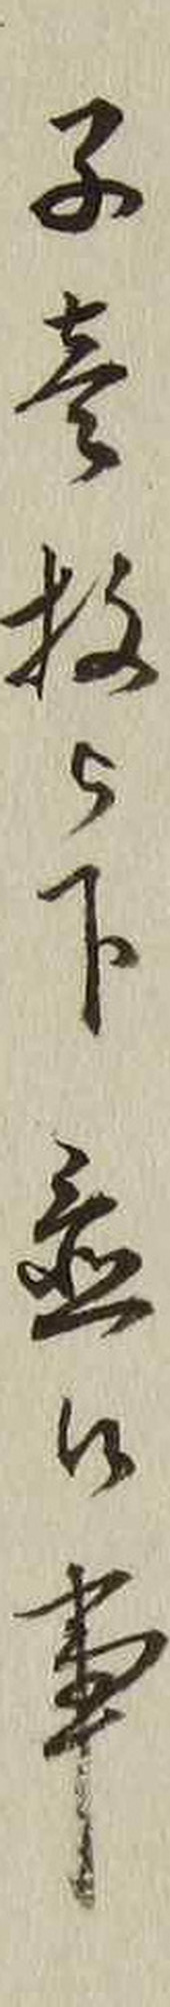子壱枚被下置候事
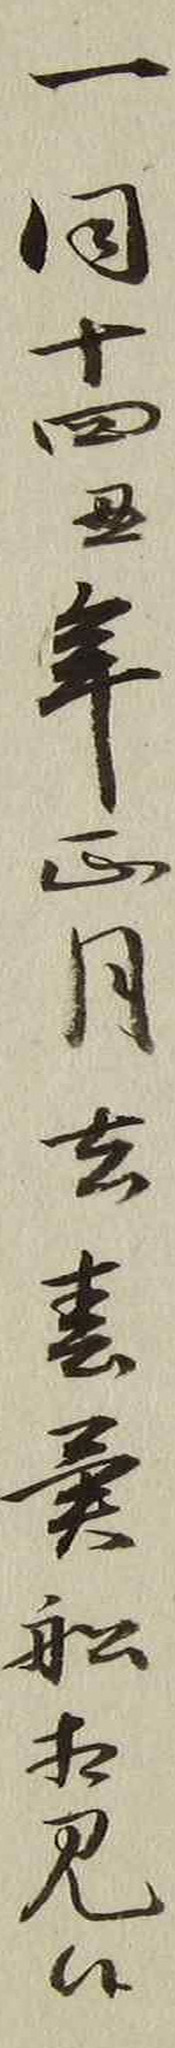一同十四丑年正月去春異船相見候
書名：諸士系譜　巻之128　た之部4
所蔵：会津若松市立会津図書館
